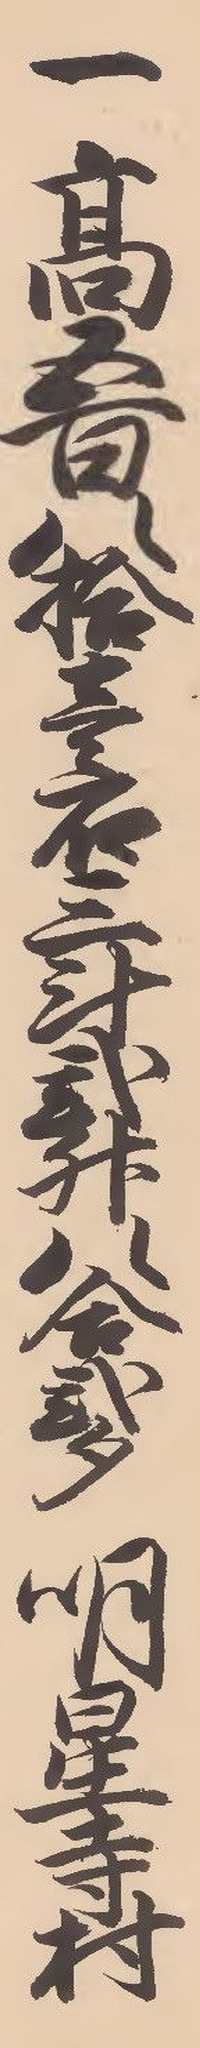一高五百八拾壱石三斗弐升八合弐勺明星寺村
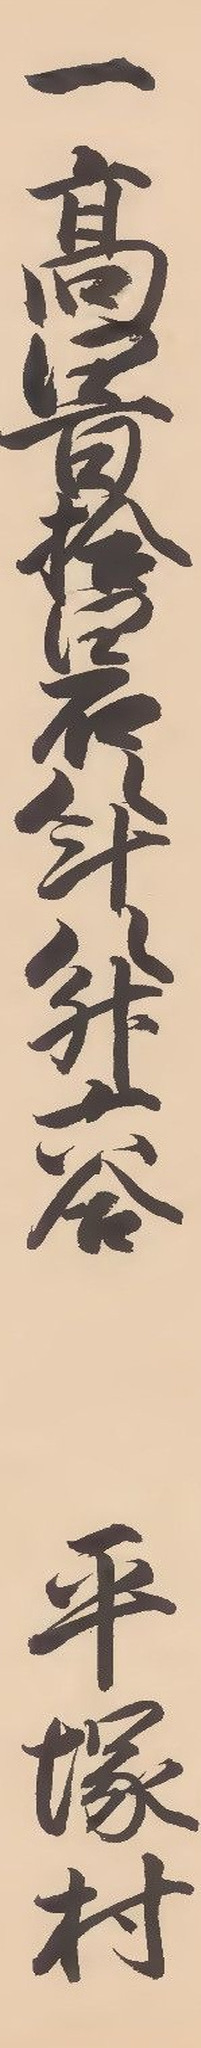一高四百拾四石八斗八升六合平塚村
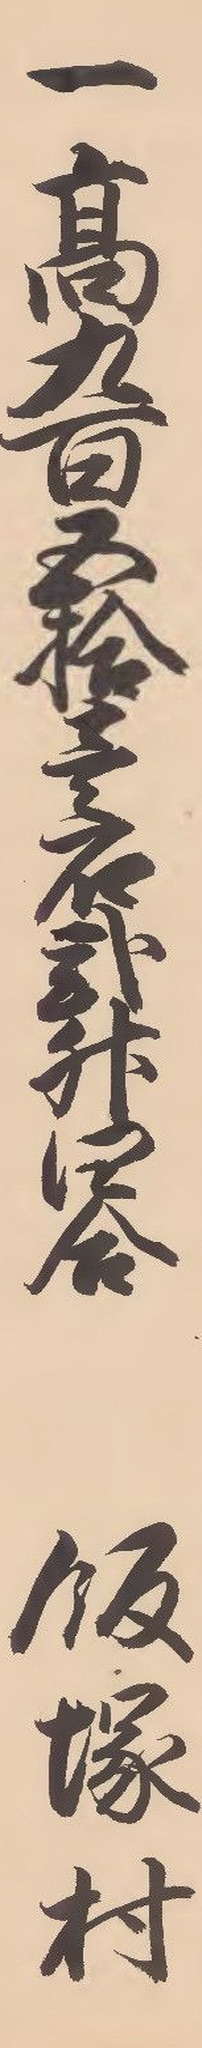一高九百五拾壱石弐升四合飯塚村
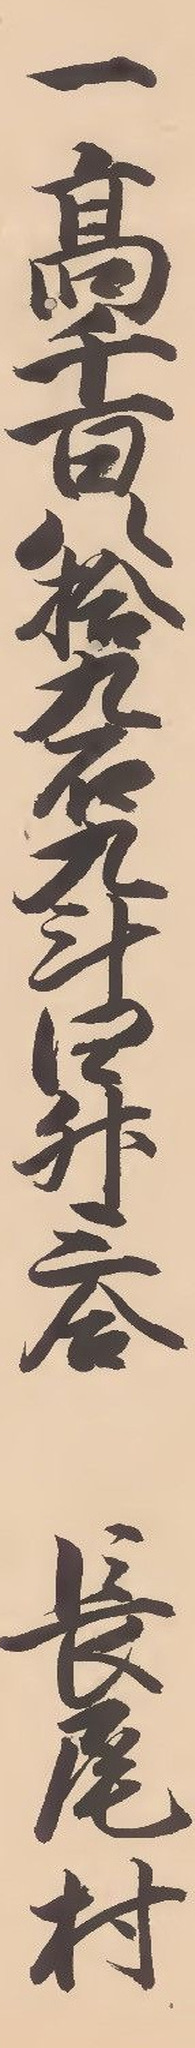一高千百八拾九石九斗四升三合長尾村
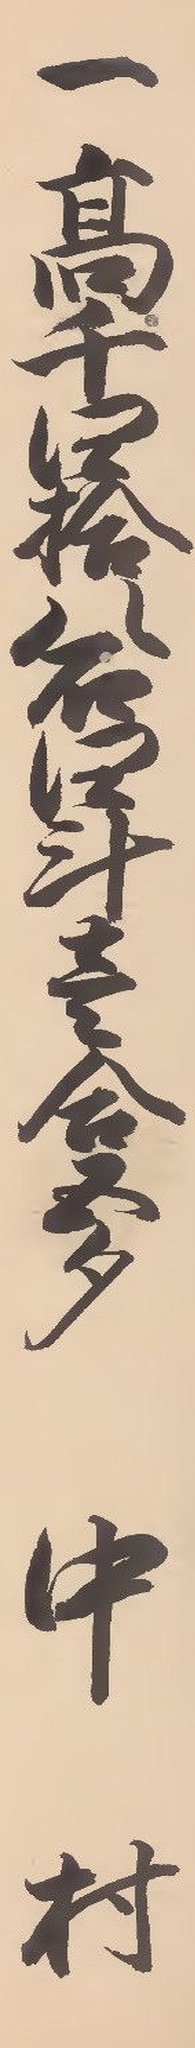一高千四拾八石四斗壱合五勺中村
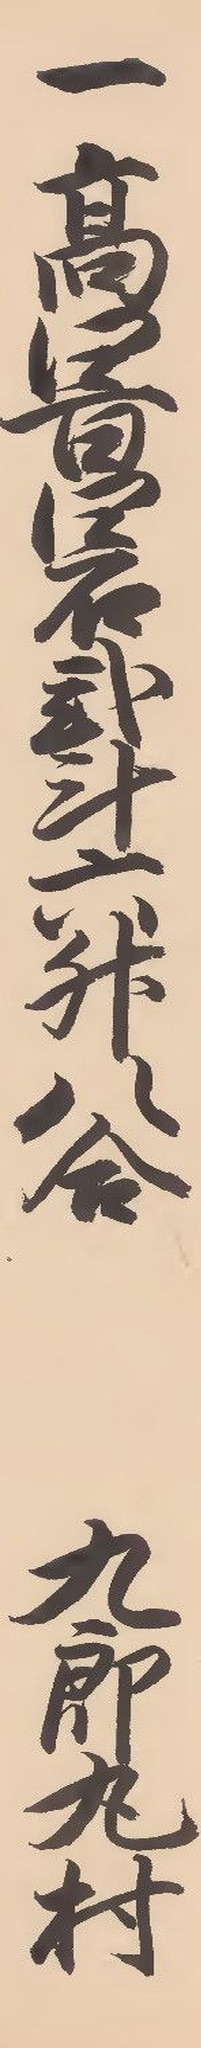一高四百四石弐斗六升八合九郎丸村
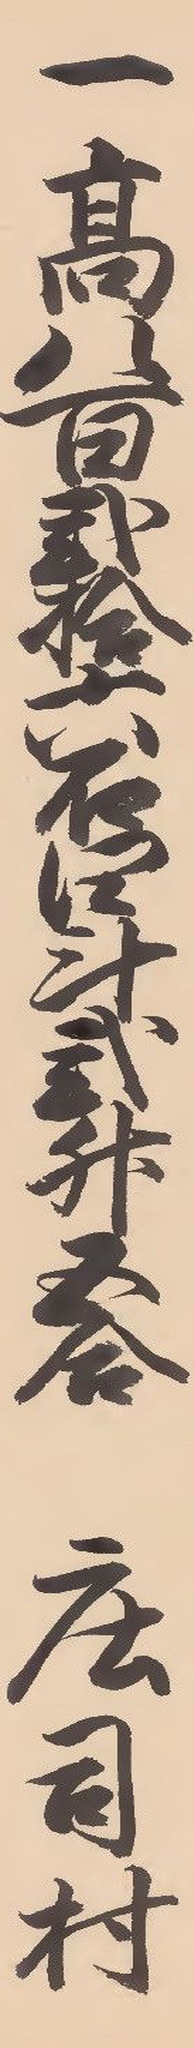一高八百弐拾六石四斗弐升五合庄司村

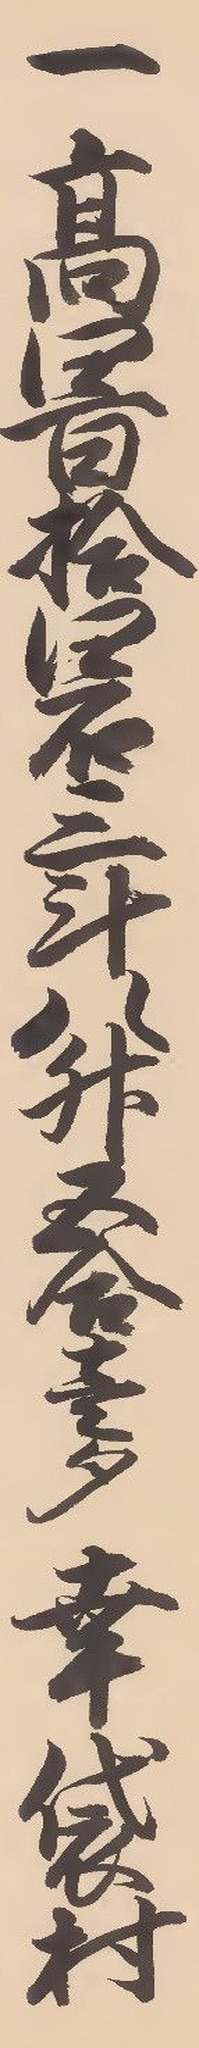一高四百拾四石三斗八升五合壱勺幸袋村
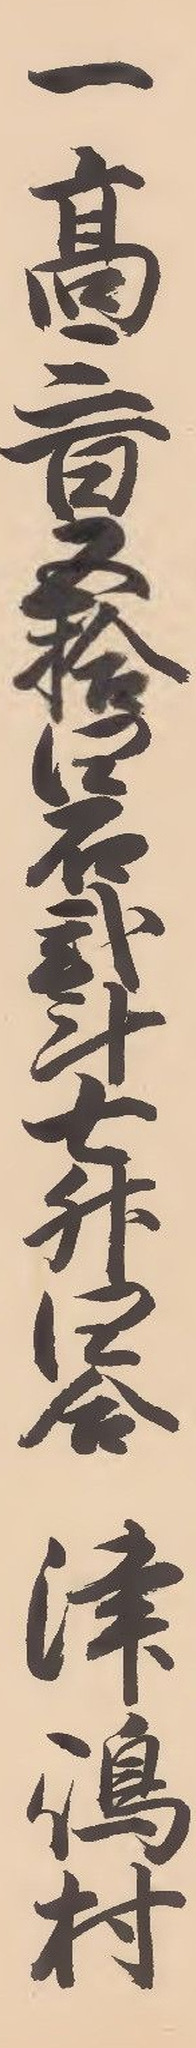一高三百五拾四石弐斗七升四合津島村
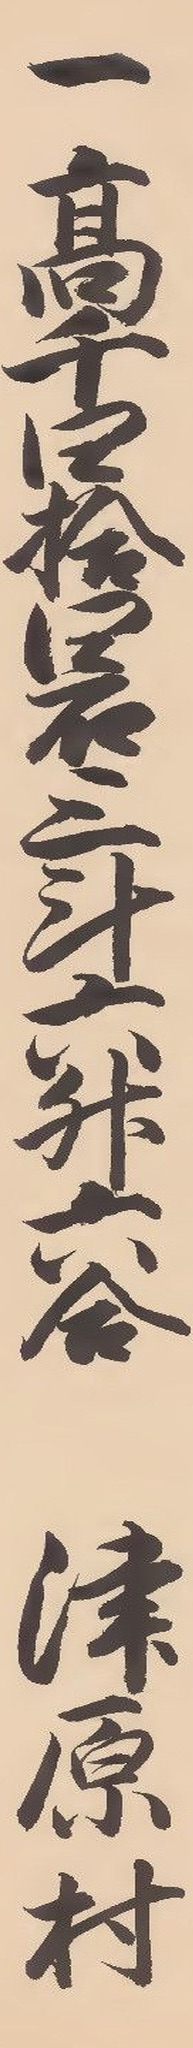一高千四拾四石三斗六升六合津原村
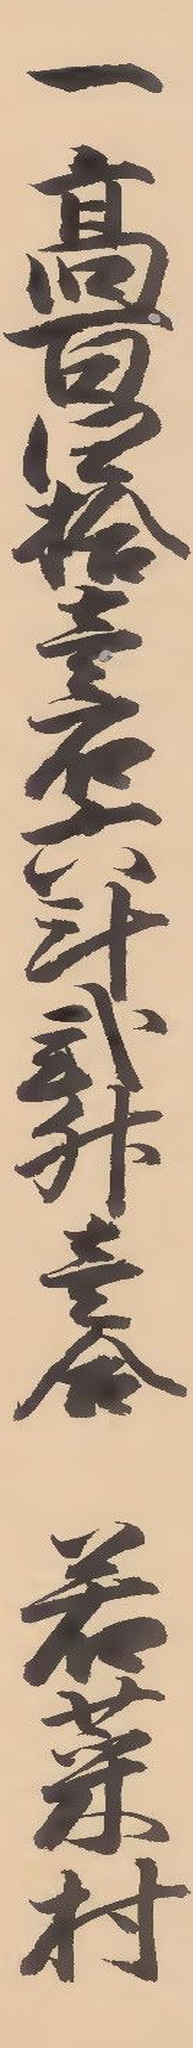一高百四拾壱石六斗弐升壱合若菜村
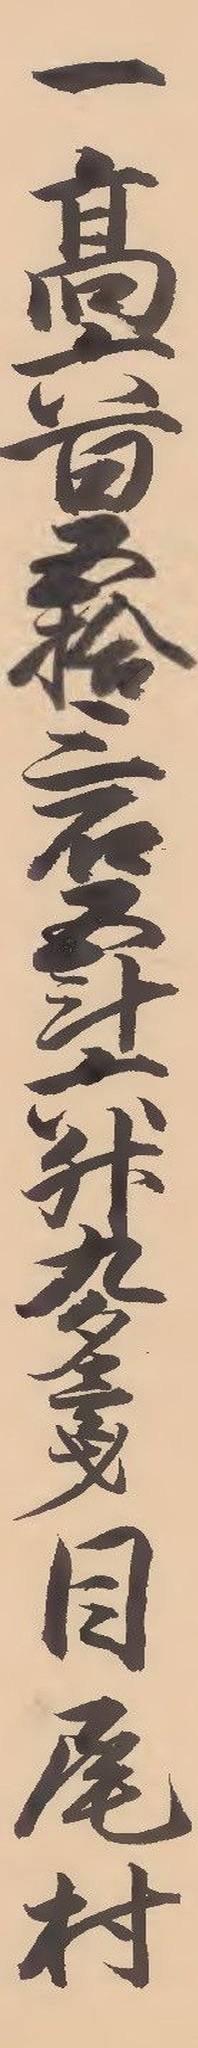一高六百五拾三石五斗六升九勺壱才目尾村
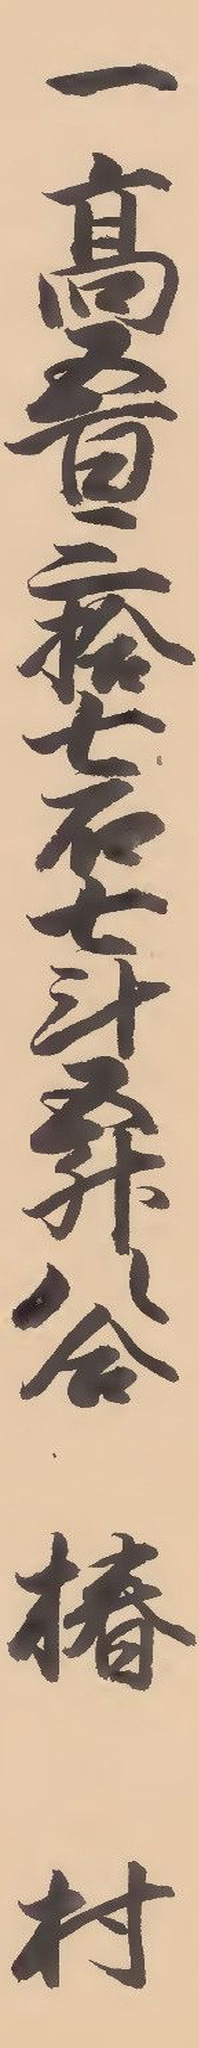一高五百三拾七石七斗五升八合椿村
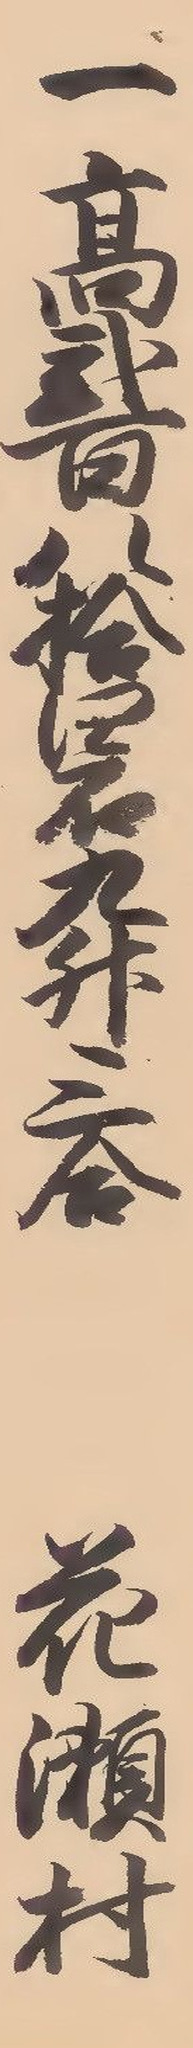一高弐百八拾四石九升三合花瀬村

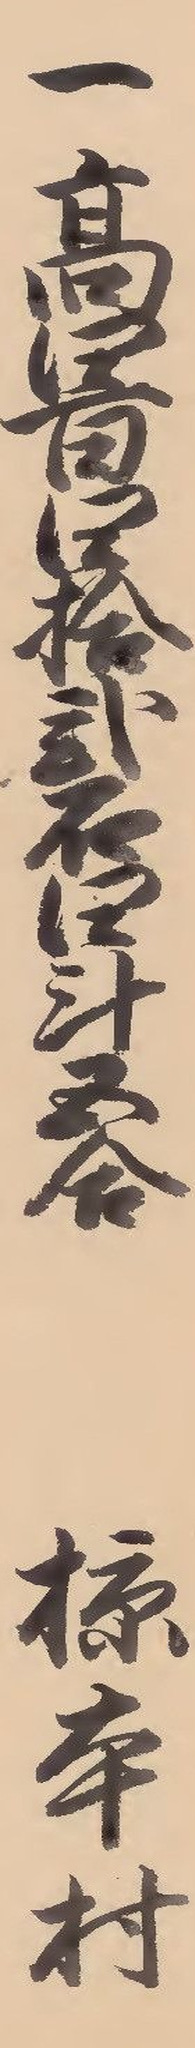一高四百四拾弐石四斗五合椋本村
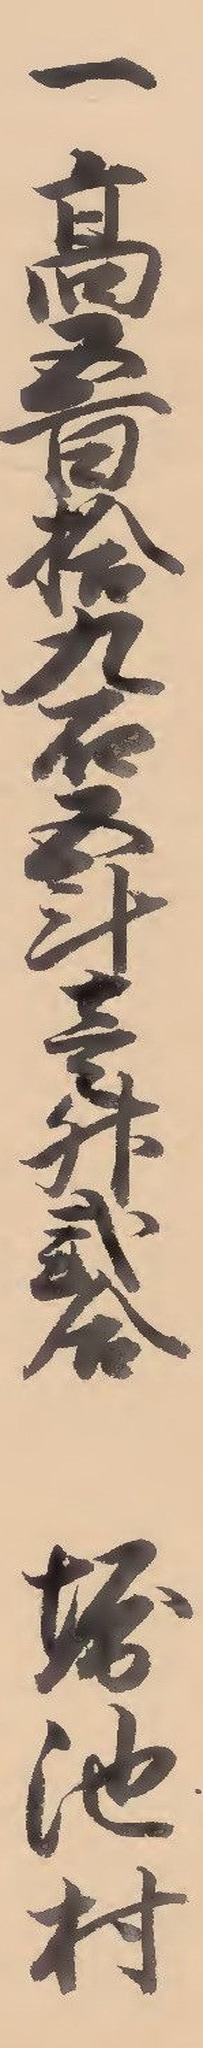一高五百拾九石五斗壱升弐合堀池村
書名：筑前国郷帳
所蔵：国立公文書館 National Archives of Japan
